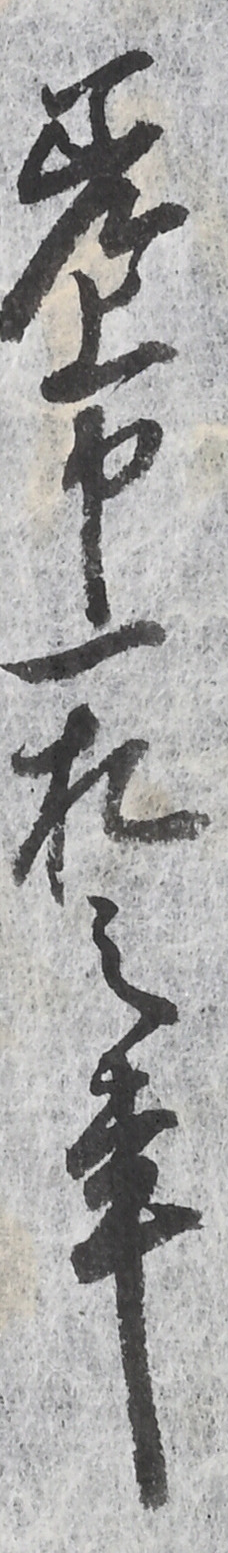差上申一札之事
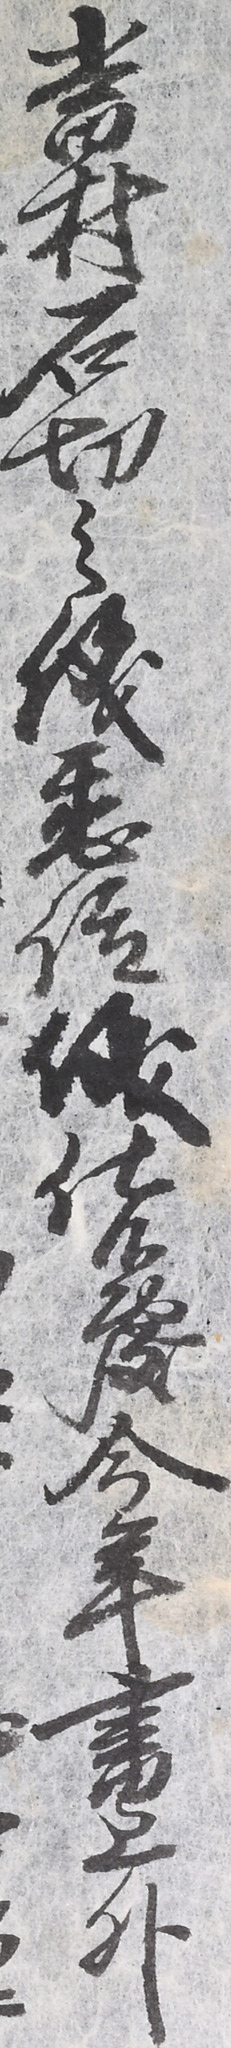当村石切之儀悉詮儀仕候処今年書上外
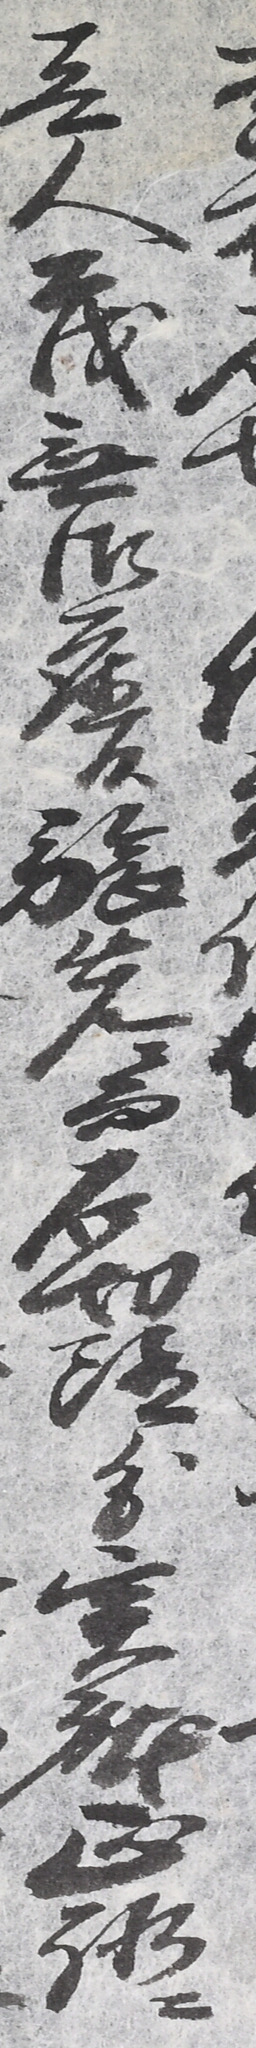壱人も無御座候旅先ニ而石切随分実躰正路ニ
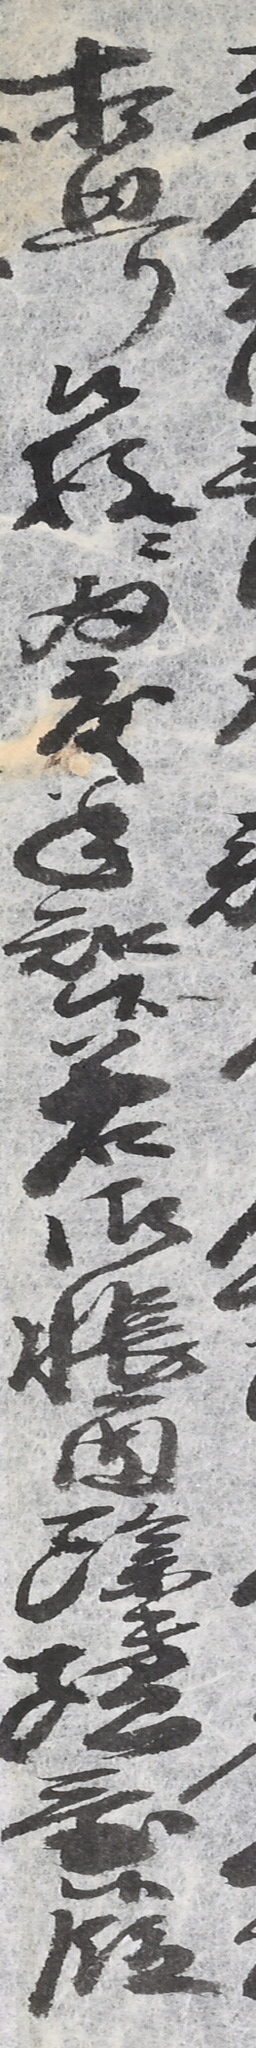相廻り候様ニ為致承知候若御帳面除キ隠置候段
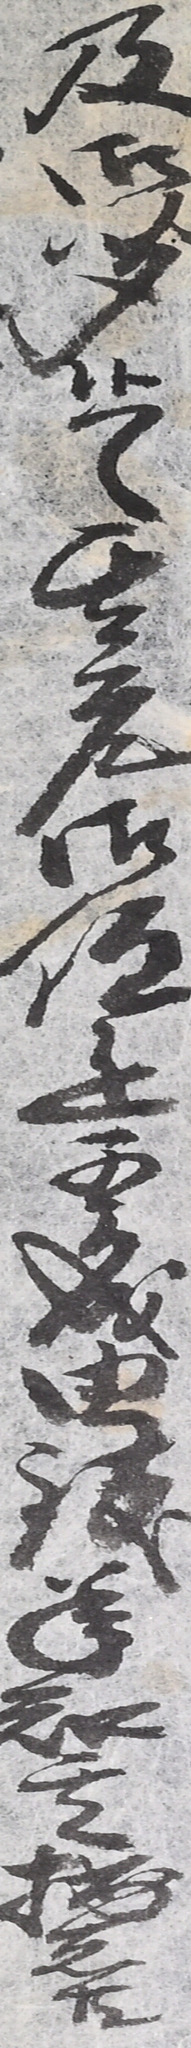及御聞候ハヽ其元御注進可被成由致承知其拙者共
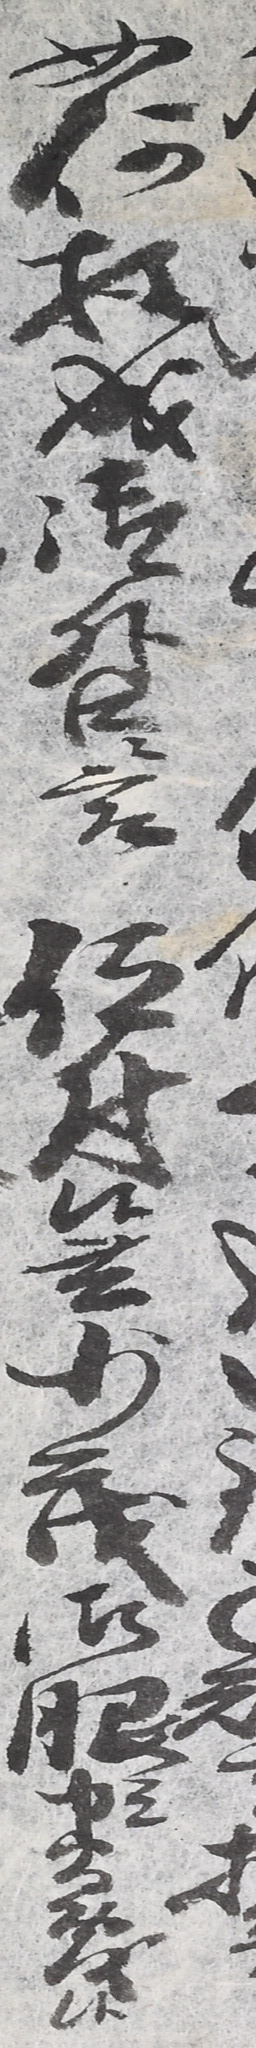如何様成御咎ニ被仰付候共少も御恨ミ申間敷候
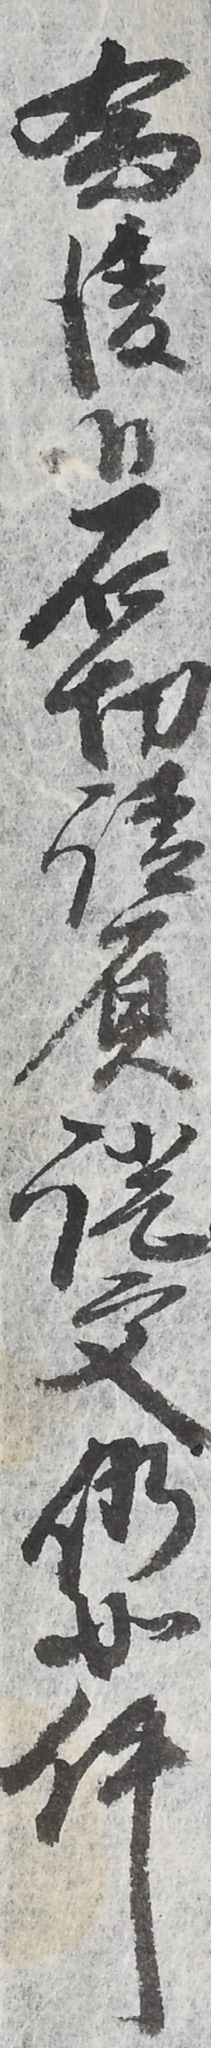為後日石切請負証文仍如件
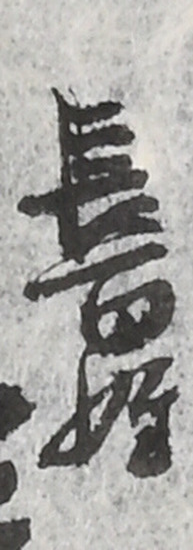長百姓
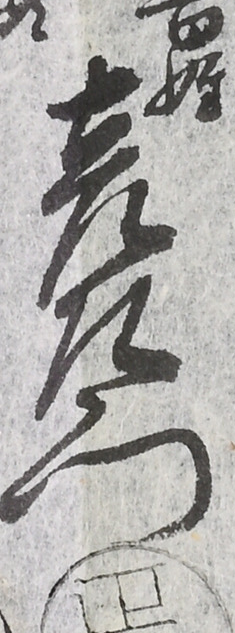彦左衛門
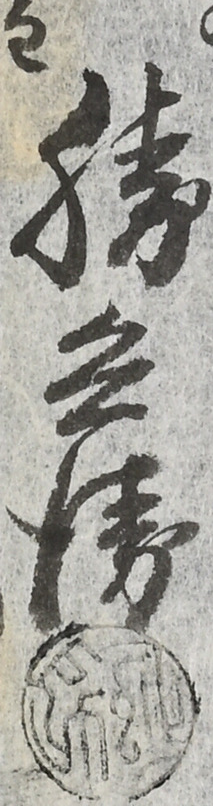勝兵衛
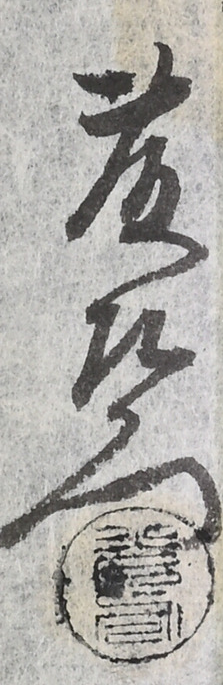藤左衛門
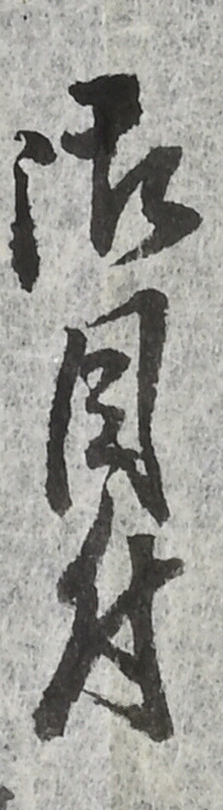御目付
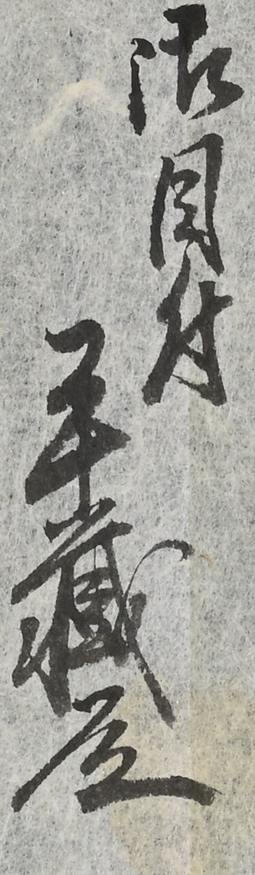御目付
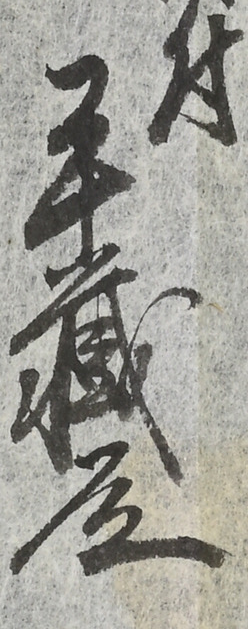平蔵殿
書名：差上申一札之事
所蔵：伊那市立高遠町図書館・合同会社AMANE
